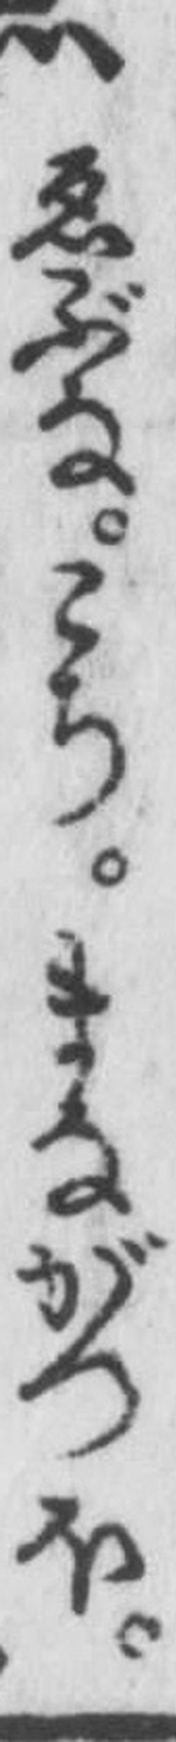時ゑぶなこちまなかつほ
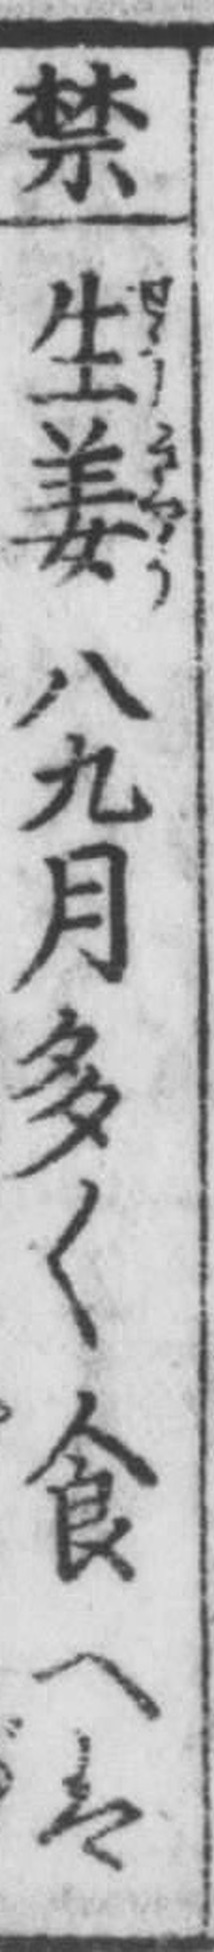禁生姜八九月多く食へば
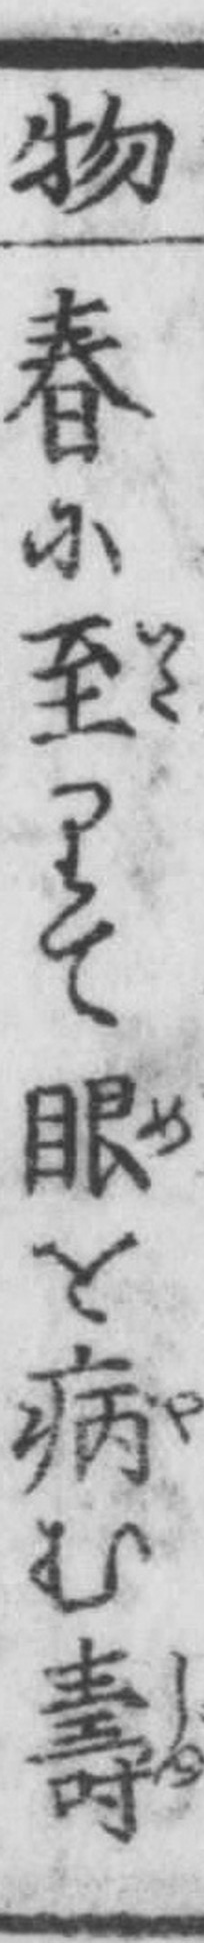物春に至りて眼を病む壽
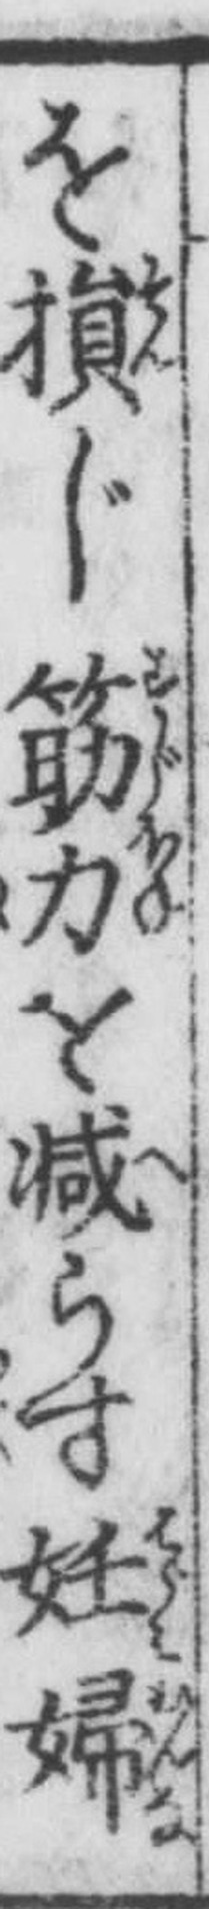を損じ筋力を減らす妊婦
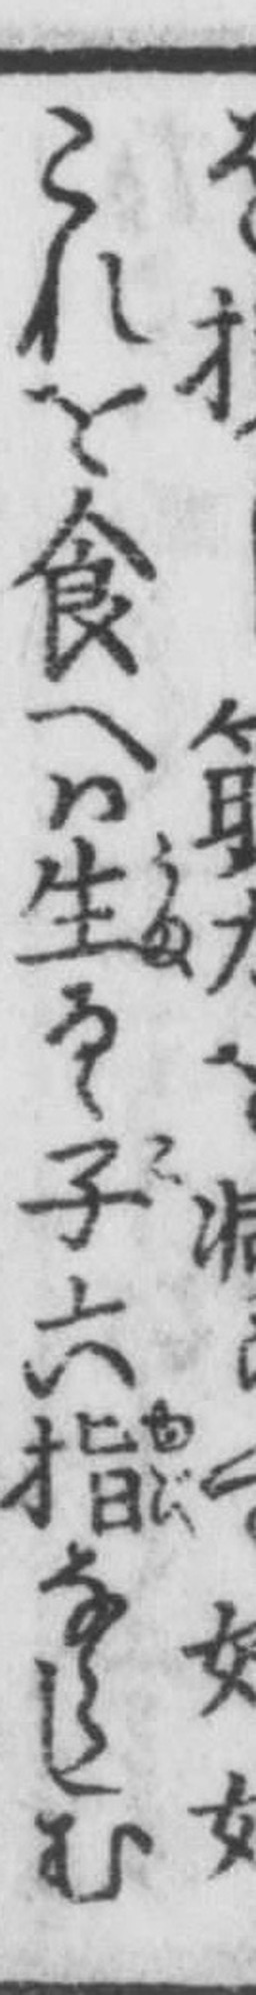これを食へハ生まるゝ子六指ならしむ
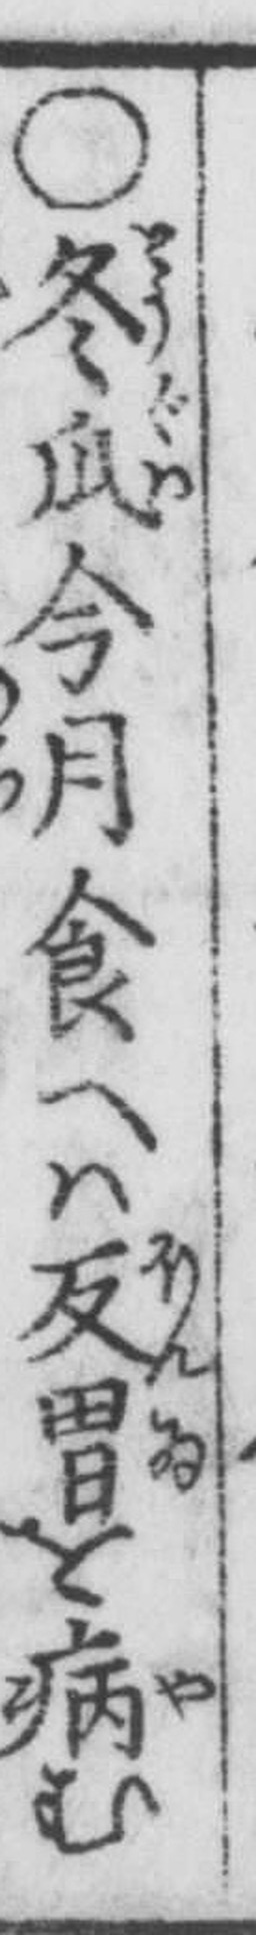〇冬瓜今月食へハ反胃を病む
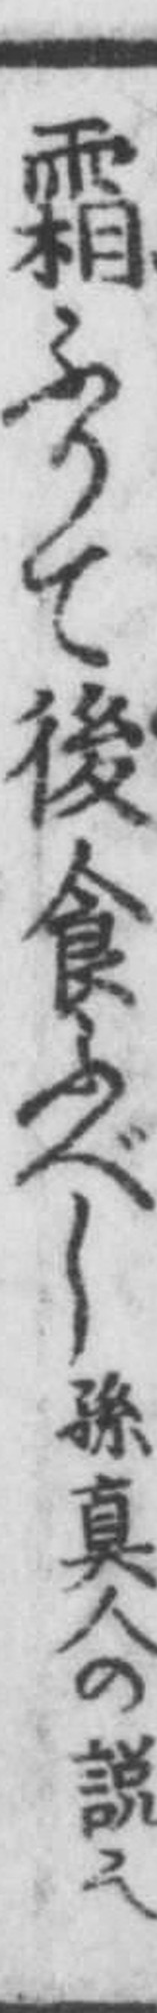霜ふりてあと食ふべし孫真人の説
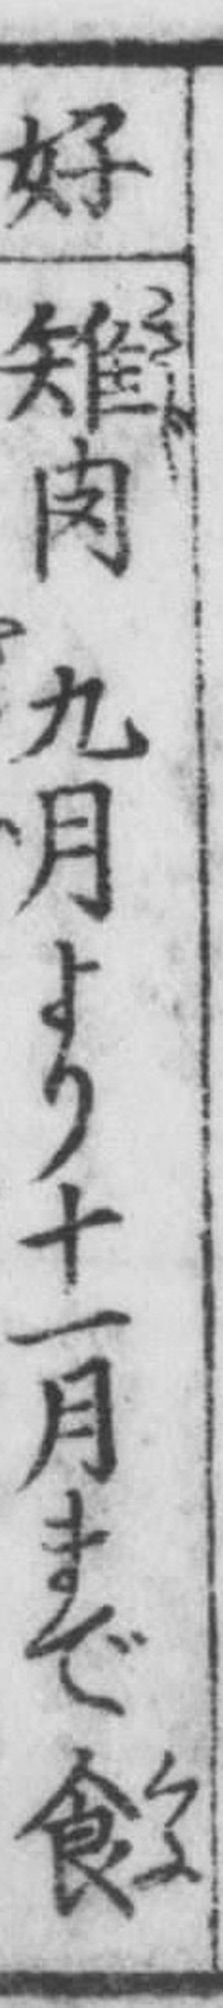好き雉肉九月より十一月まで食
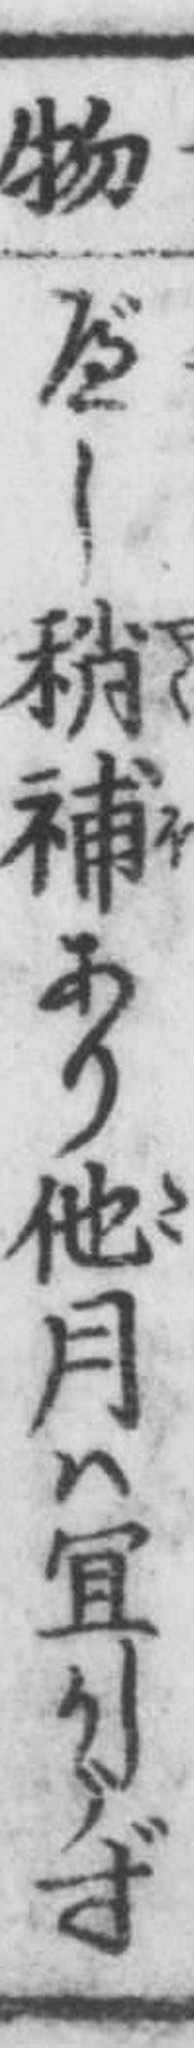物べし稍補あり他月ハ宜しからず
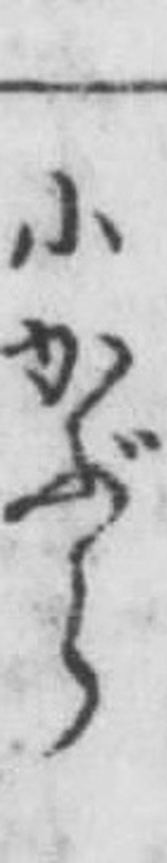小かぶら
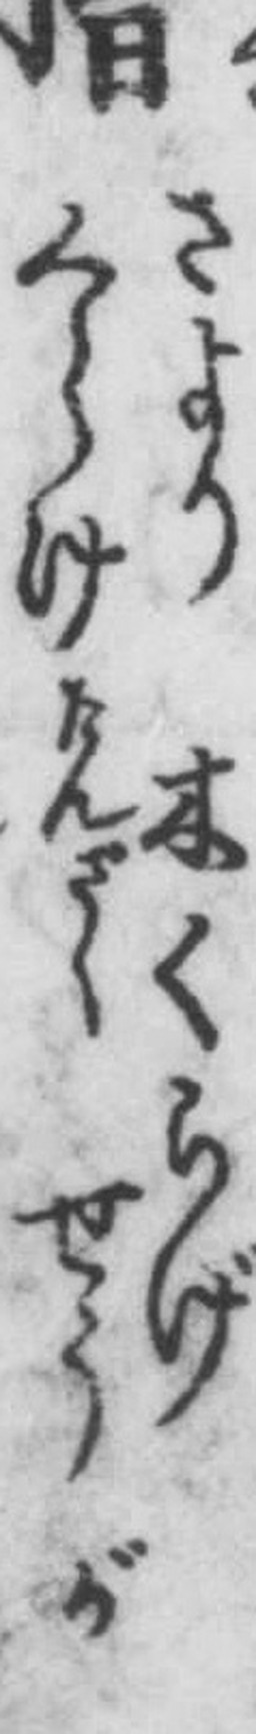膾くらけたんざくせうが
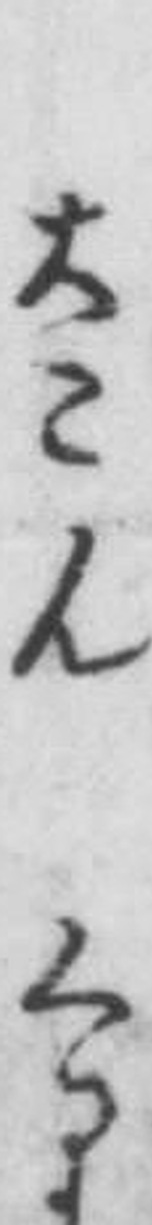大こんくり

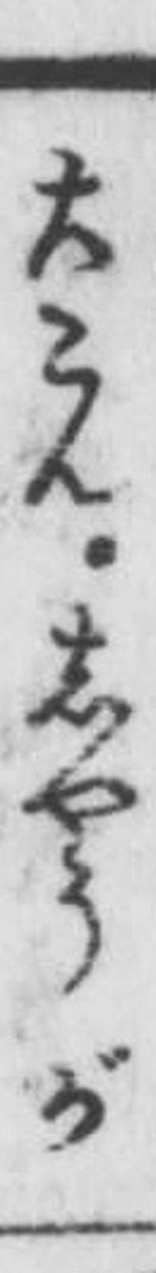大こんしやうが清汁
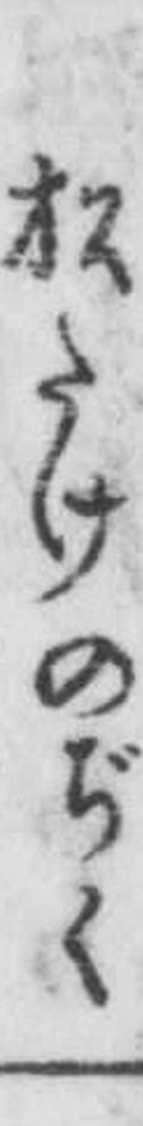松たけのぢく
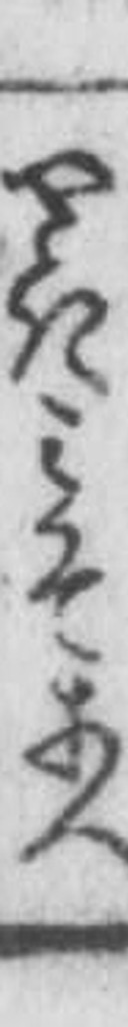やきミそあへ
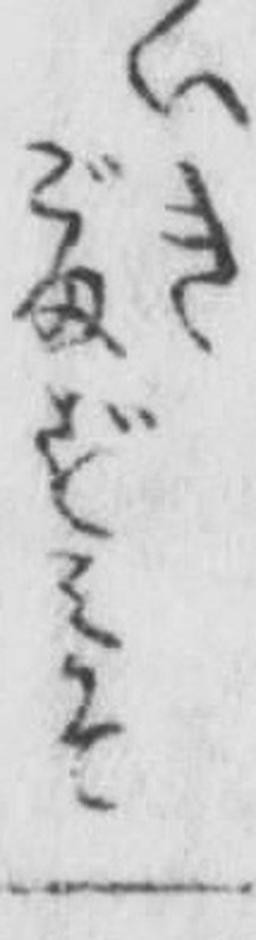ごまずミそ
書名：当世料理筌
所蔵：大阪府立大学学術情報センター 国文学研究資料館
